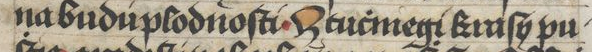na budu plodnoſtí.Ztuċniegí kraſy pu¬
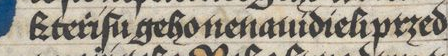kteṙíſu geho nenauidieli przed
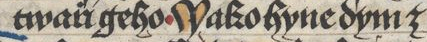twaṙí geho.Yako hyne dym z
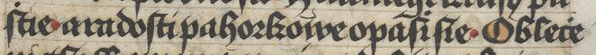ẛtie.a radoſti pahorkowe opaẛi ſie.Obleċe
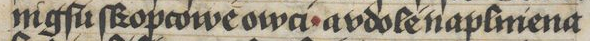ni gſu ſkopcowe owcí.a vdole naplniena
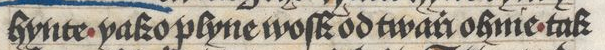hynte.yako plyne woſk od twaṙi ohnie.tak
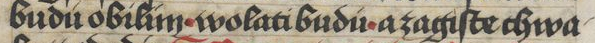budú obilím.wolati budú.a zagiſte chwa¬
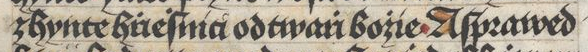zhynte hṙieẛníci odtwaṙi bożíe.Aſprawed¬
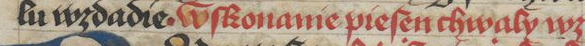lu wzdadie.Wſkonaníe píeſen chwaly wz¬
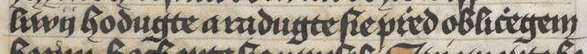liwij hodugte a radugte ſie pṙed obliċegem
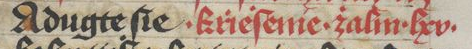Adugte ſie .kṙieẛeníe.żalm.lxv.
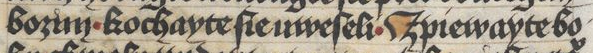bozim.kochayte ſie uweſeli.Zpiewayte bo¬
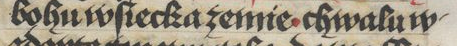bohu wẛiecka zemie.chwalu w
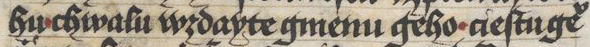hu.chwalu wzdayte gmenu geho.cieſtu gev
